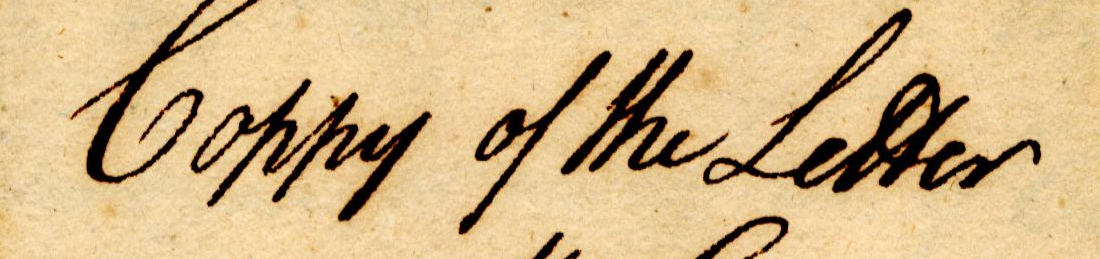Coppy of the letter
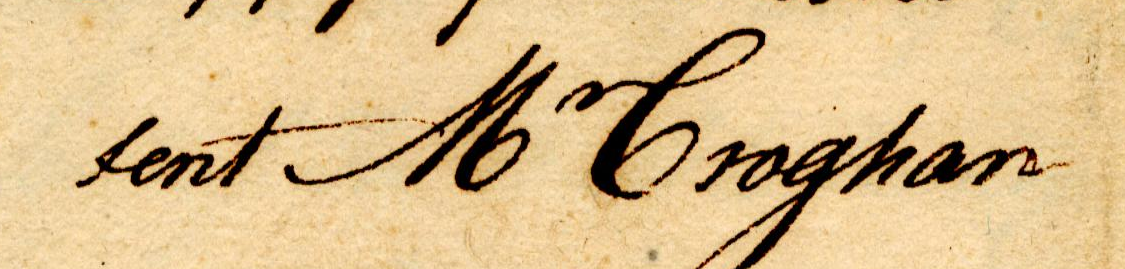sent to M^r Croghan
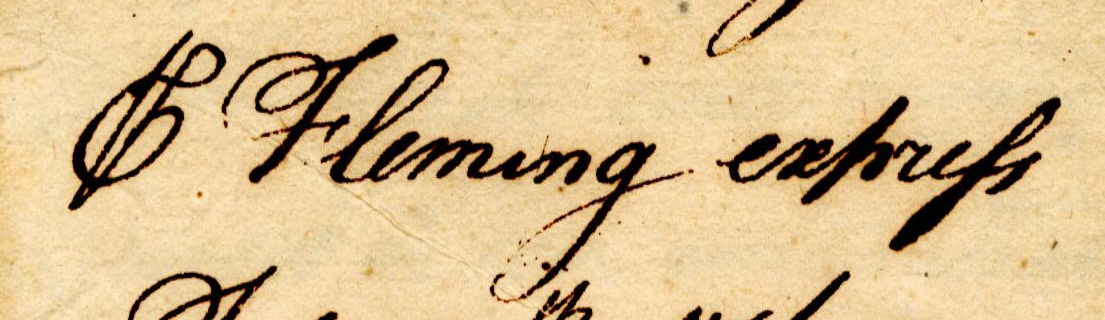& Fleming express
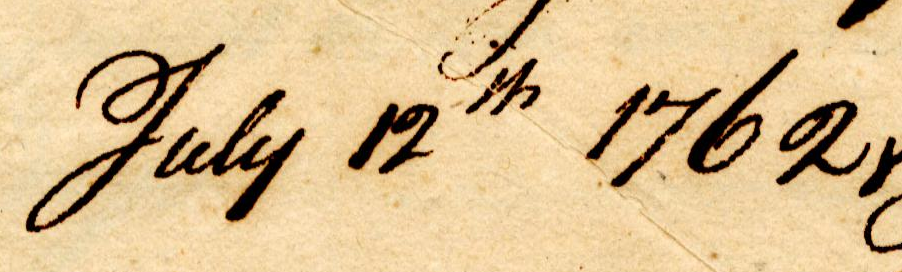July 12^th 1762,
